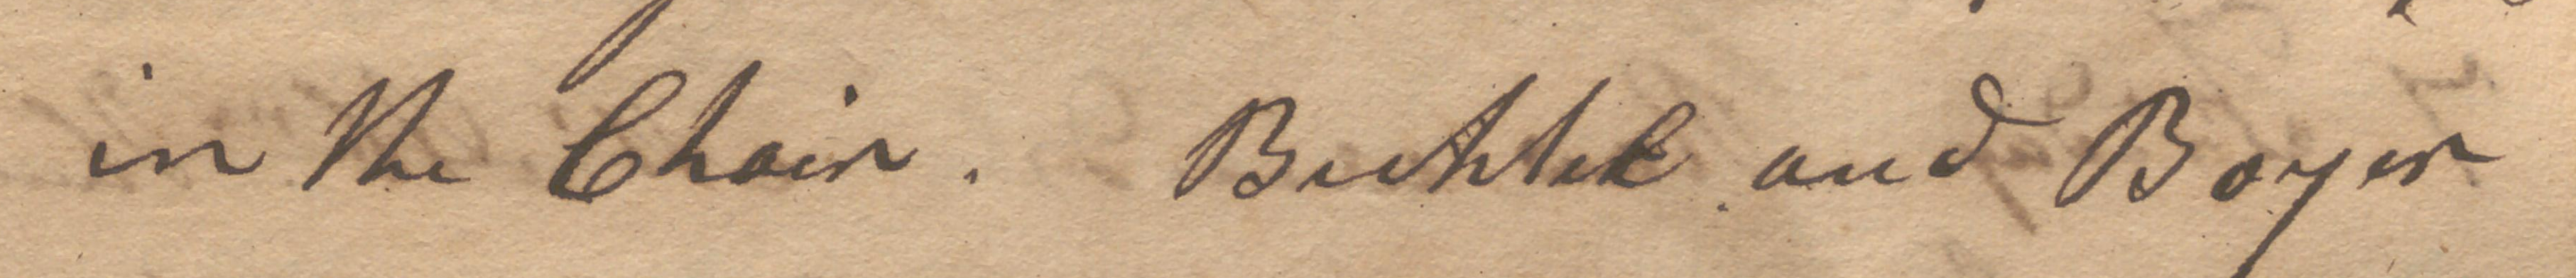in the Chair. Bechtel and Boyer
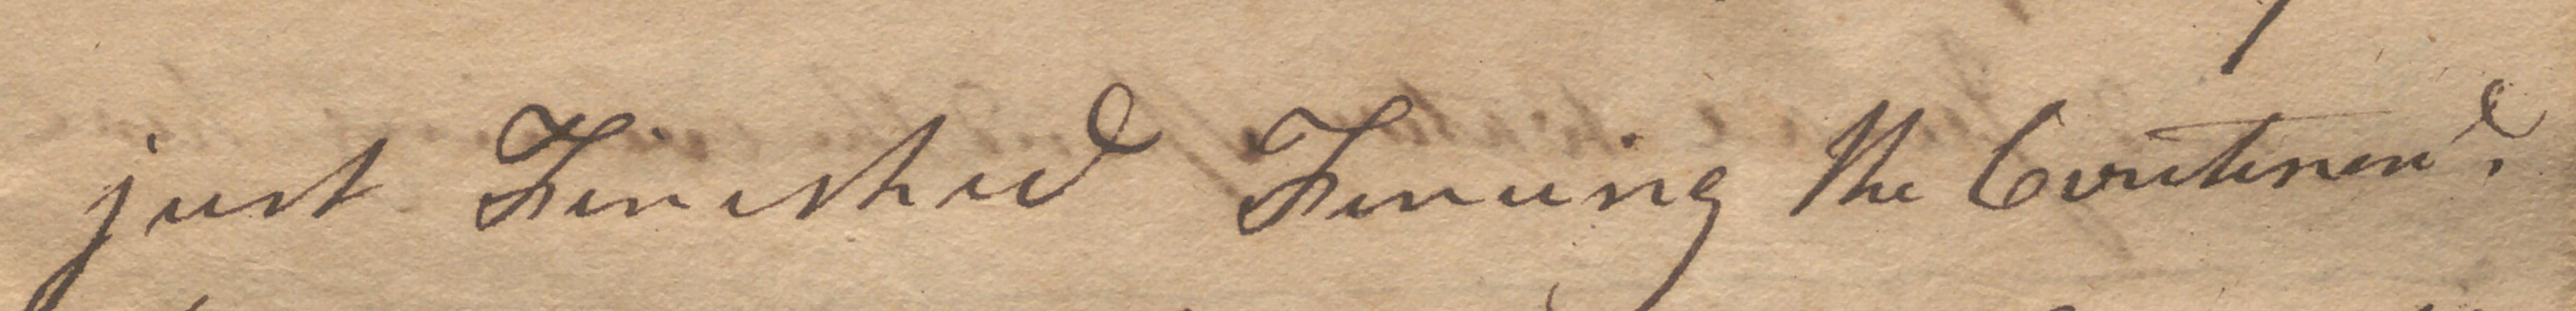just Finished Fencing the Continen^l.
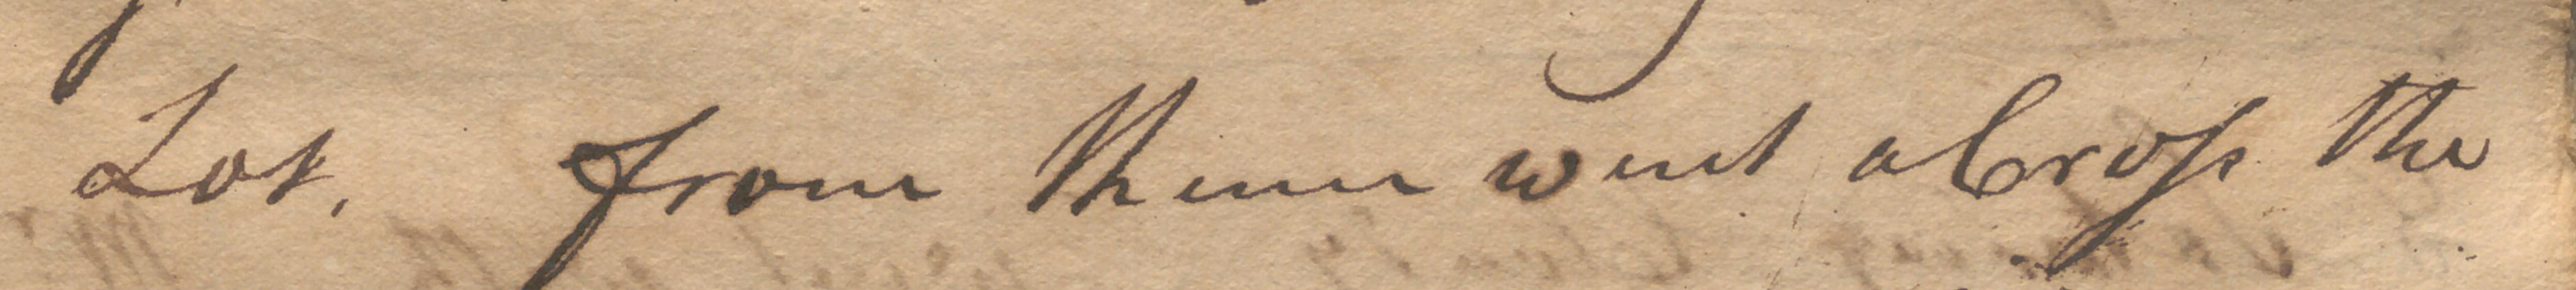Lot. from thence went a Cross the
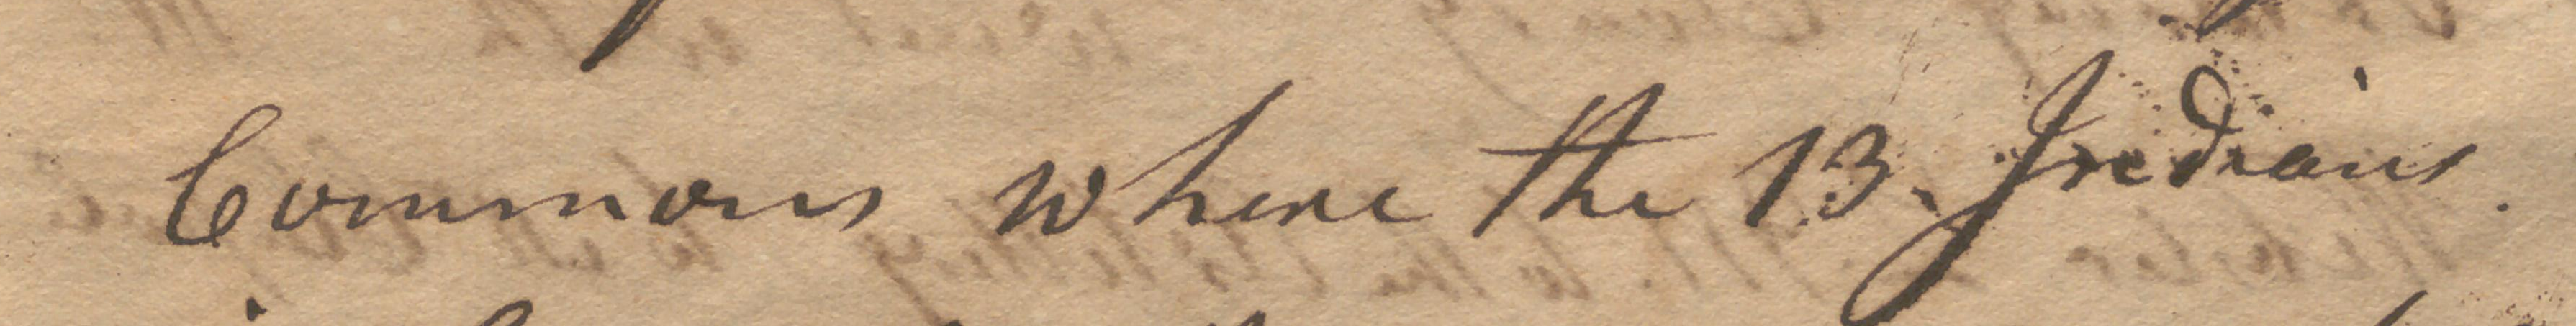Commons where the 13 Indians
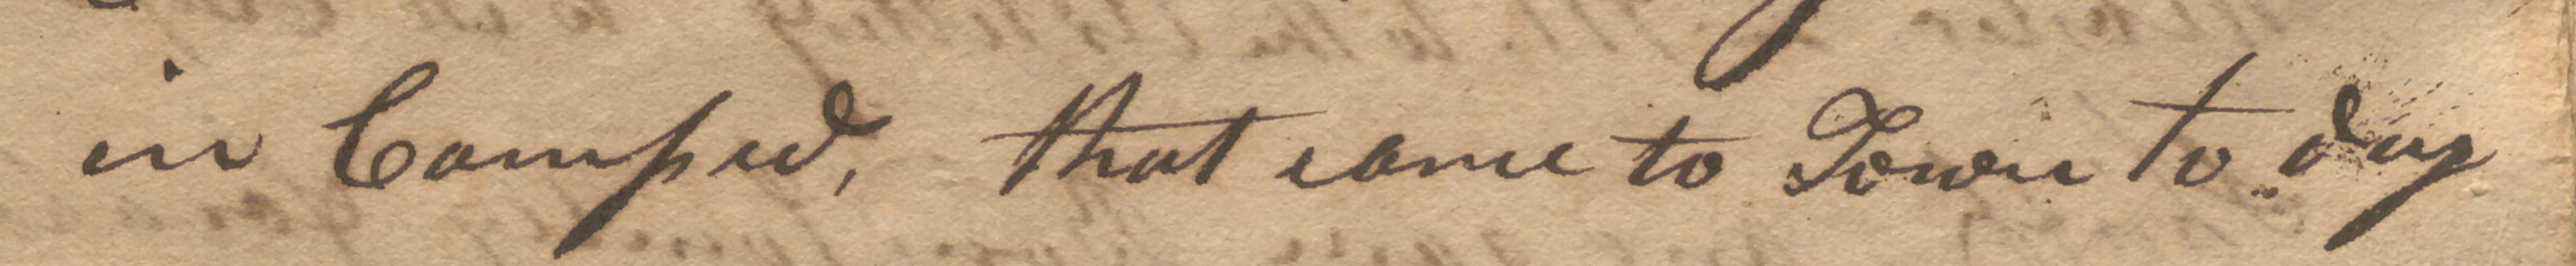in Camped, that came to Town to day
